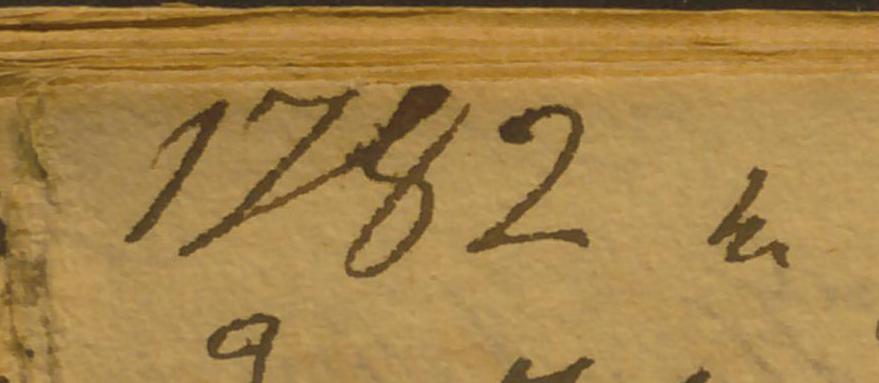1782
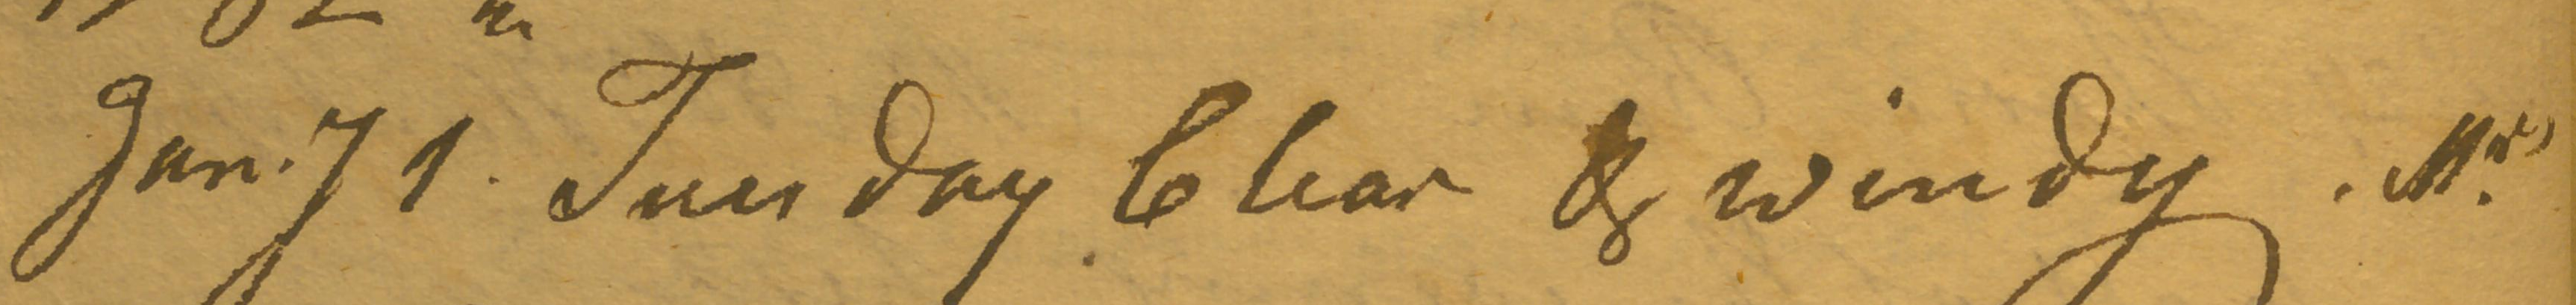Jan^y. 1^th. Tuesday Clear & windy M^rs.
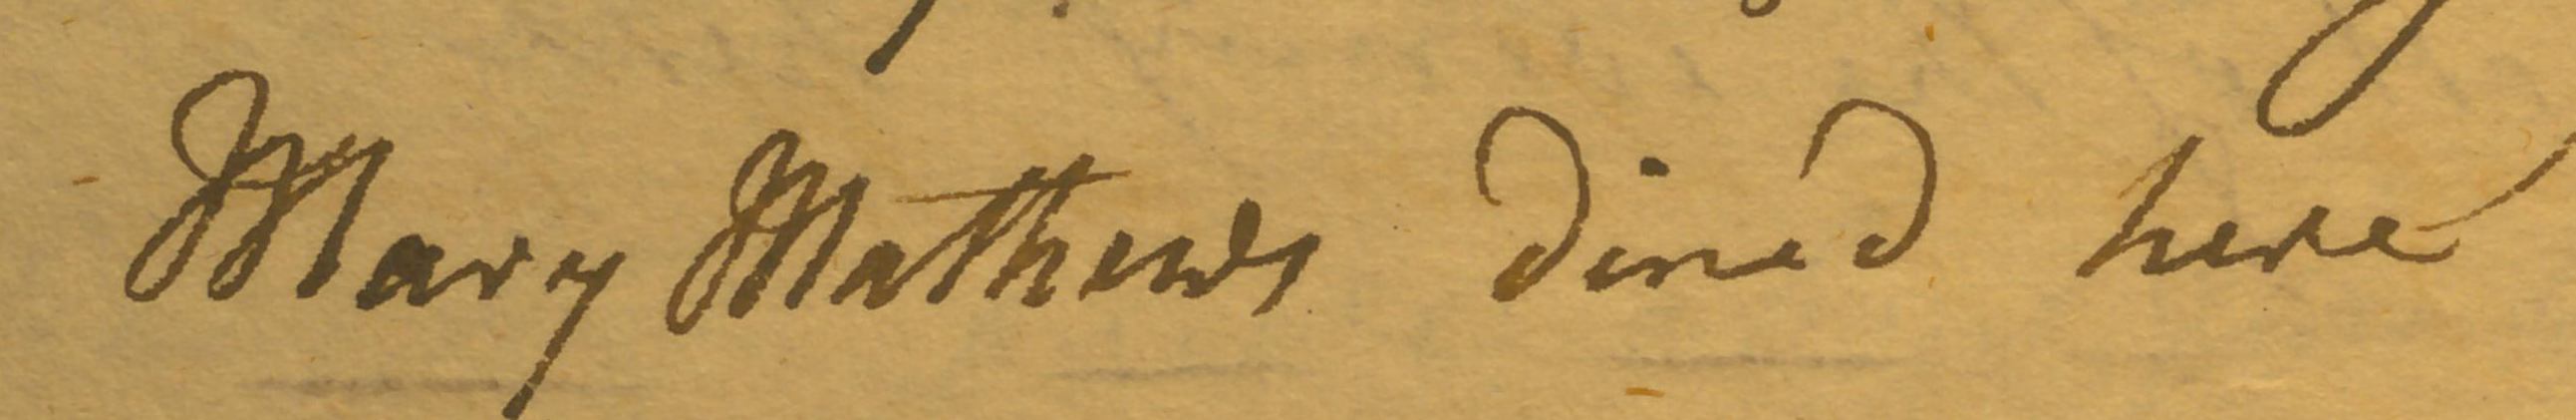Mary Mathews dined here
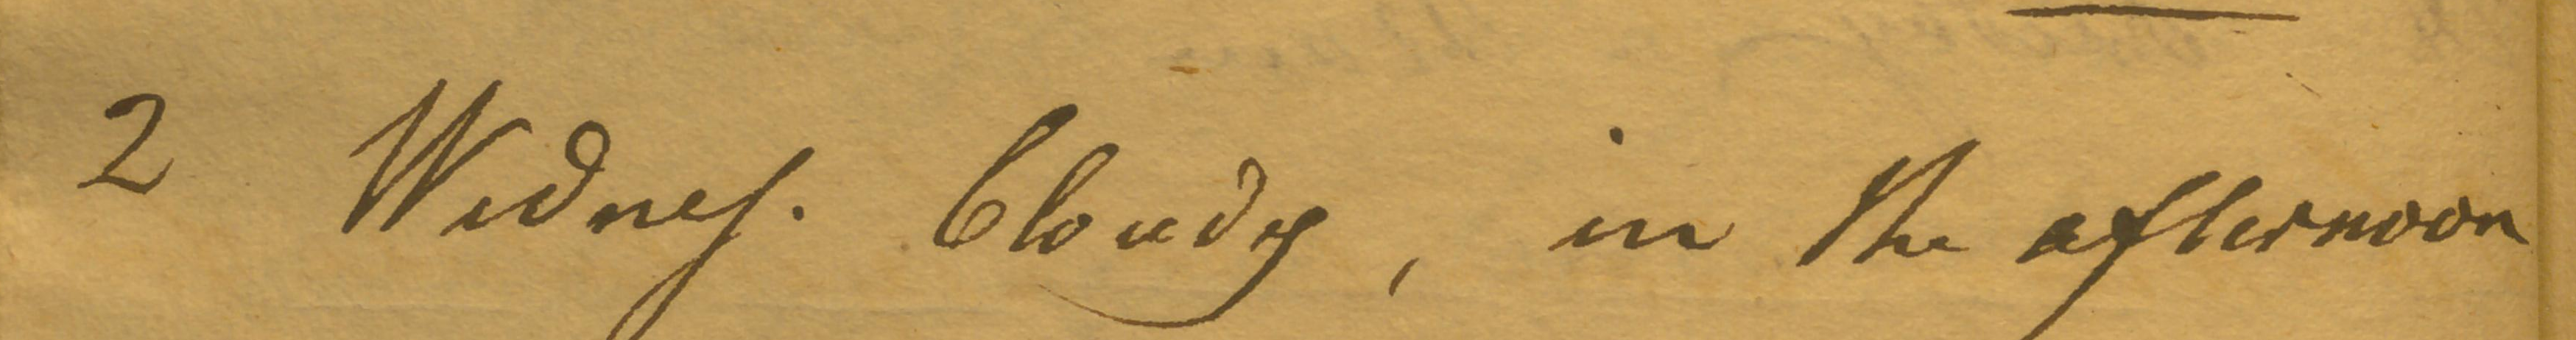2 Wednes. Cloudy in the afternoon
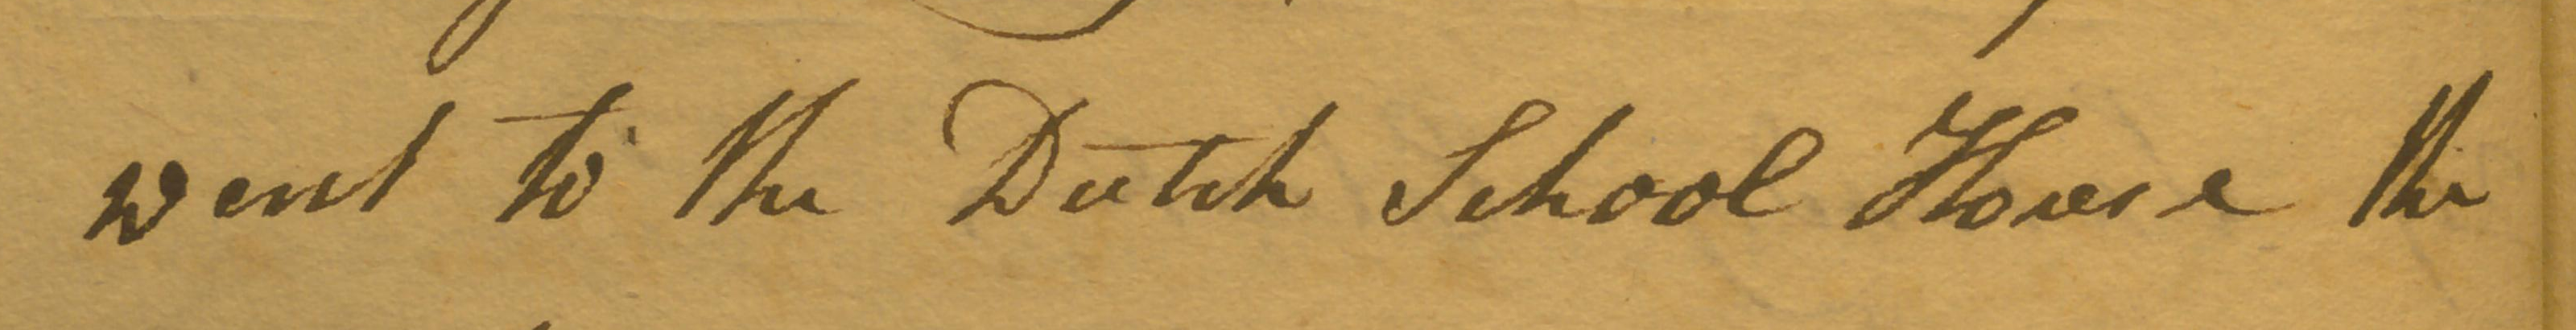went to the Dutch School House the
